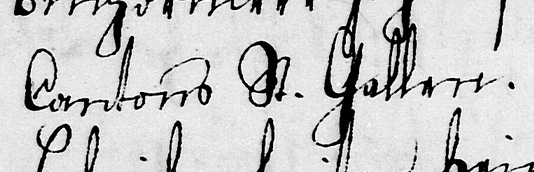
Cantons St. Gallen.
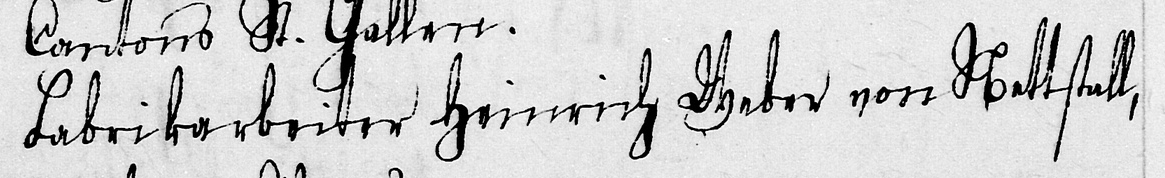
Fabrikarbeiter Heinrich Weber von Nettstal¬
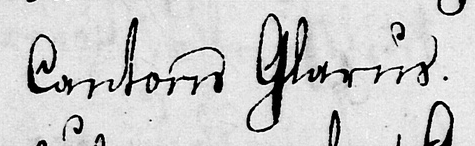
Cantons Glarus.
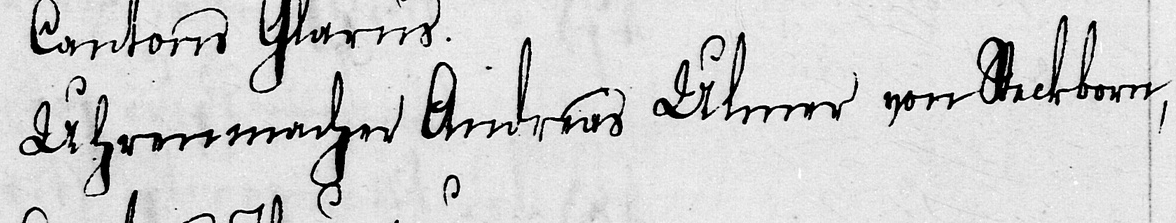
Uhrenmacher Andreas Ulmer von Steckborn,
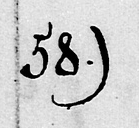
58.)
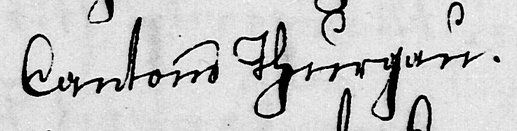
Cantons Thurgau.
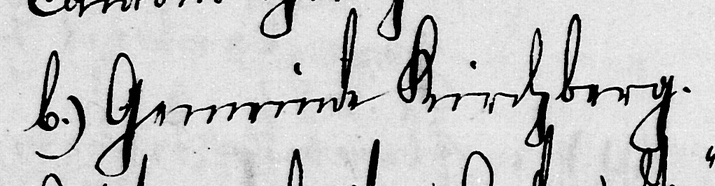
b.) Gemeinde Kirchberg.
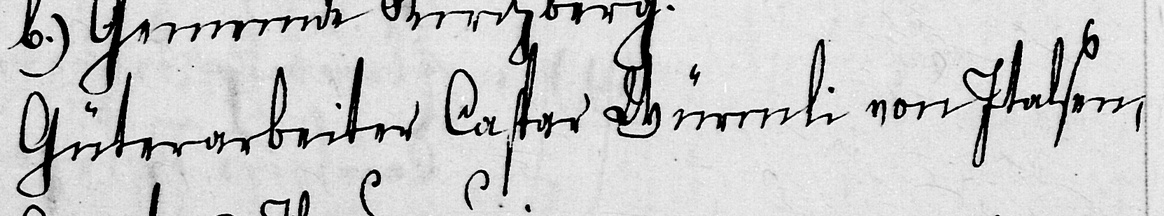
Güterarbeiter Caspar Würmli von Italsen,
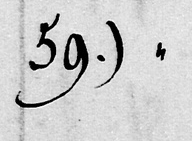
59.) “
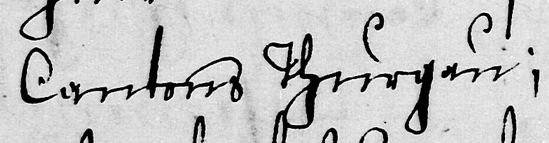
Cantons Thurgau;
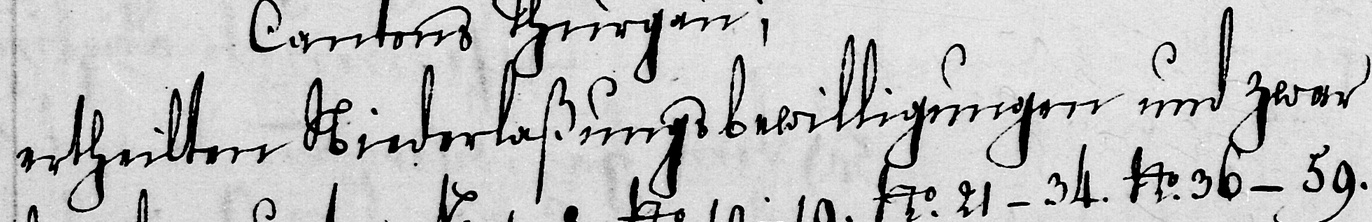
ertheilten Niederlaßungsbewilligungen und zwar
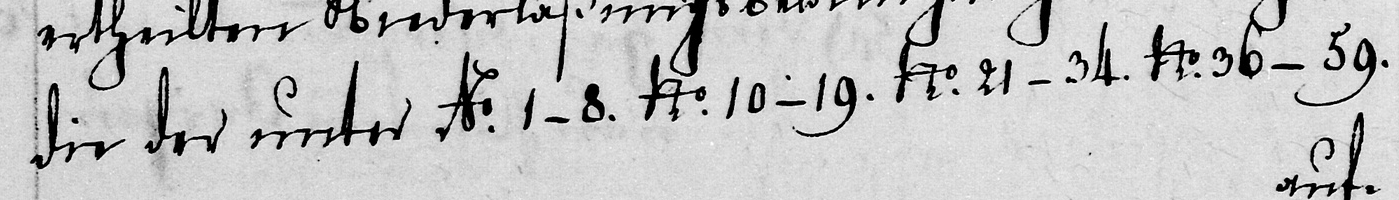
die der unter No. 1–8. No. 10–19. No. 21–34. No. 36–59.
